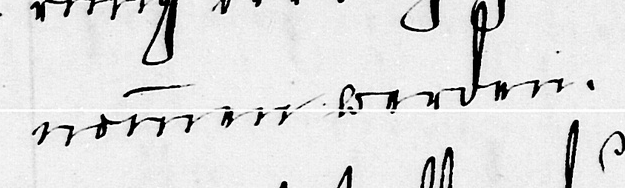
nommen werden.
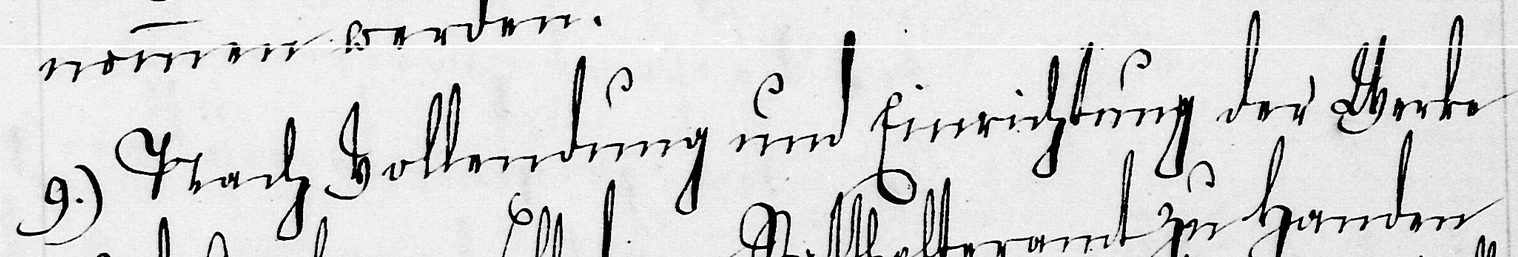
9.) Nach Vollendung und Einrichtung der Werke
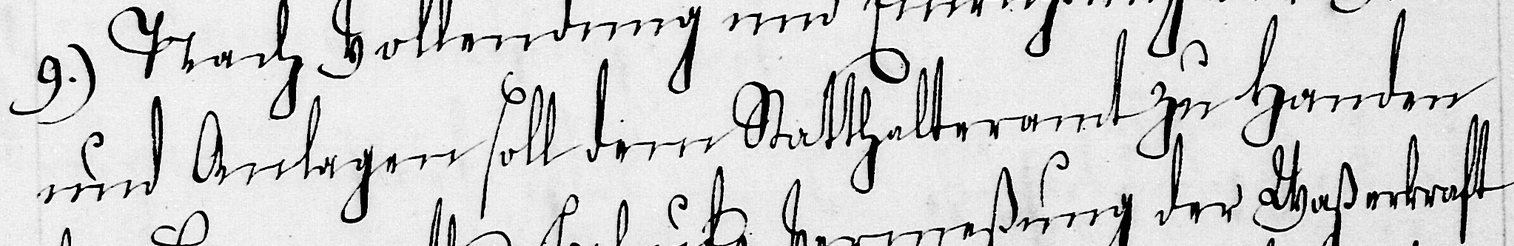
und Anlagen soll dem Statthalteramt zu Handen
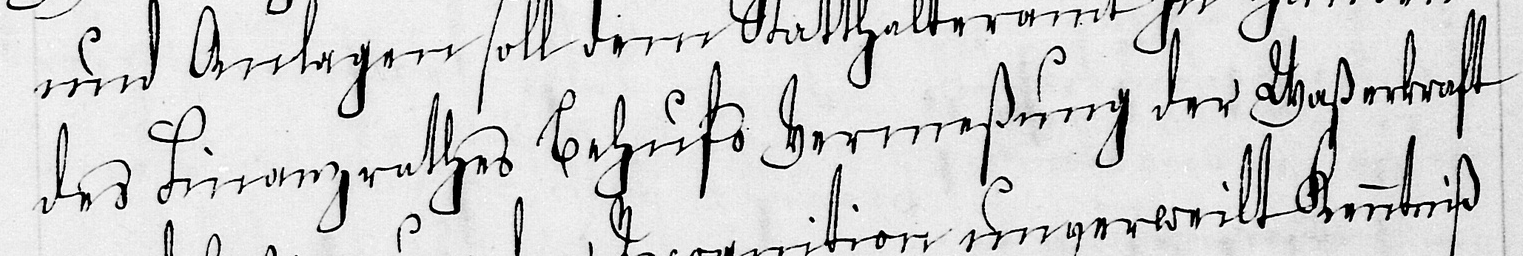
des Finanzrathes Behufs Vermeßung der Waßerkraft
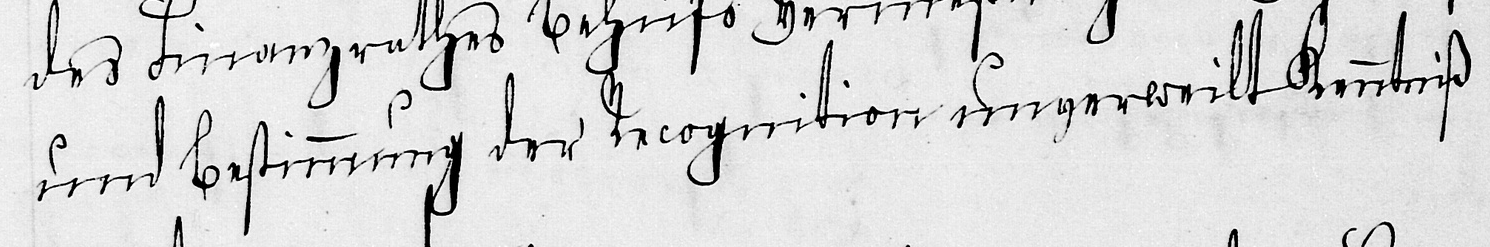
und Bestimmung der Recognition unverweilt Kenntniß
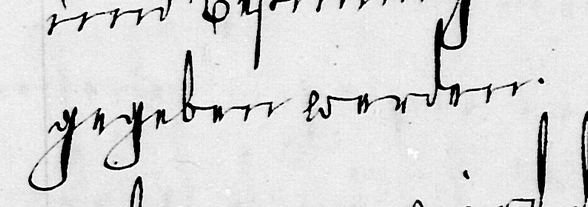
gegeben werden.
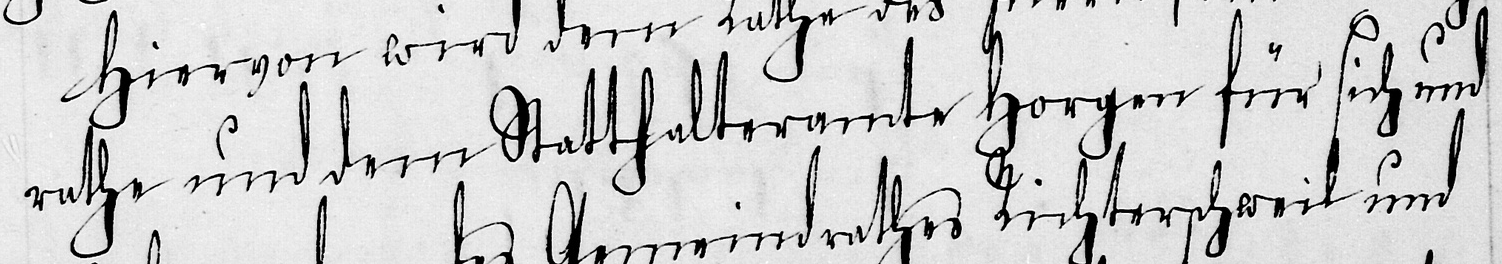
rathe und dem Statthalteramte Horgen für sich und
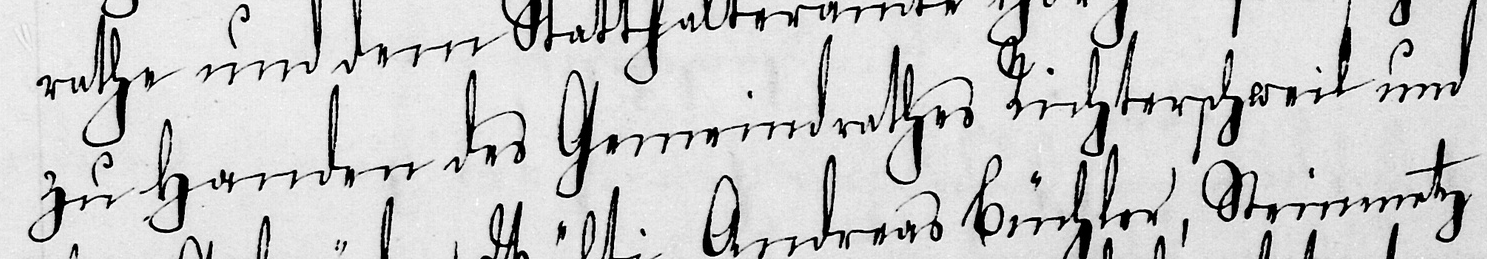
zu Handen des Gemeindrathes Richterschweil und
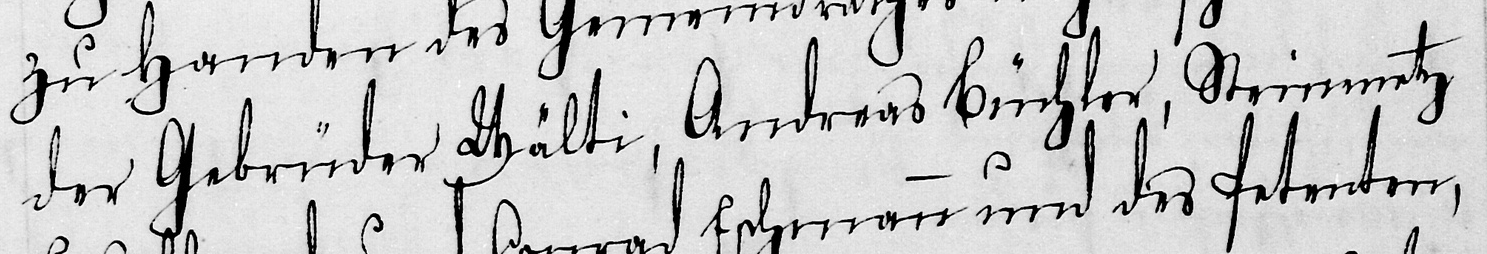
der Gebrüder Wälti, Andreas Büchler, Steinmetz
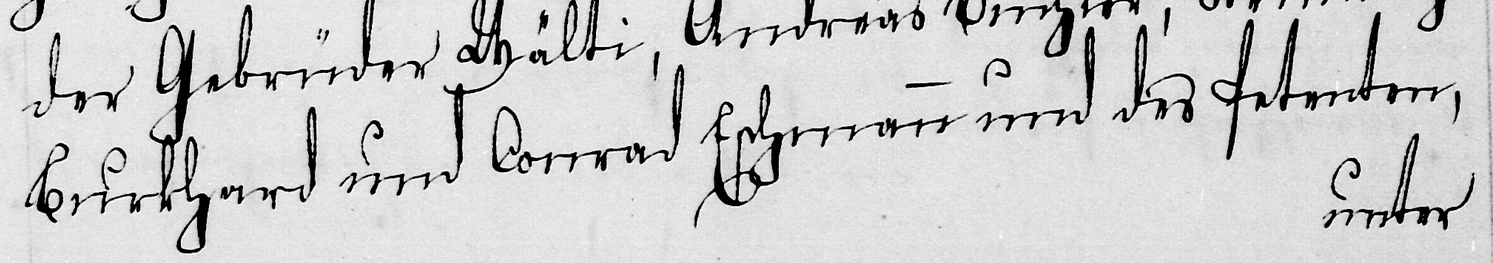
Burkhard und Conrad Eschmann und des Petenten,
